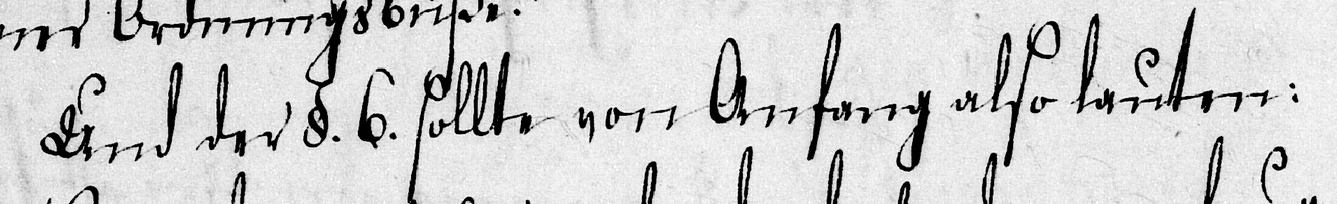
Und der §. 6. sollte von Anfang also lauten:
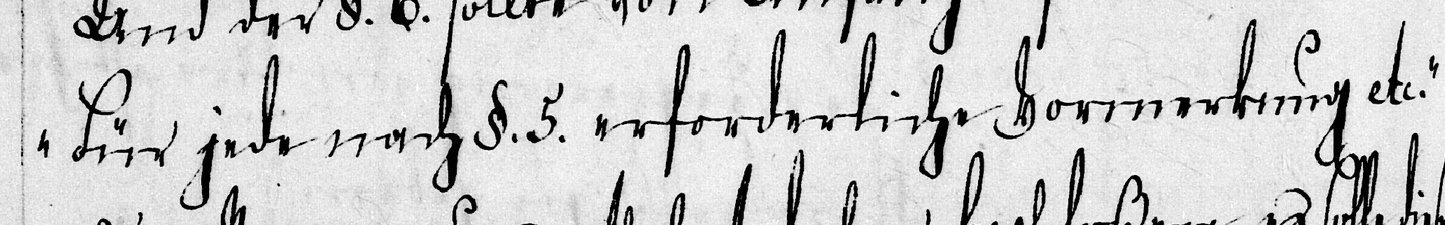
„Für jede nach §. 5. erforderliche Vormerkung et¬
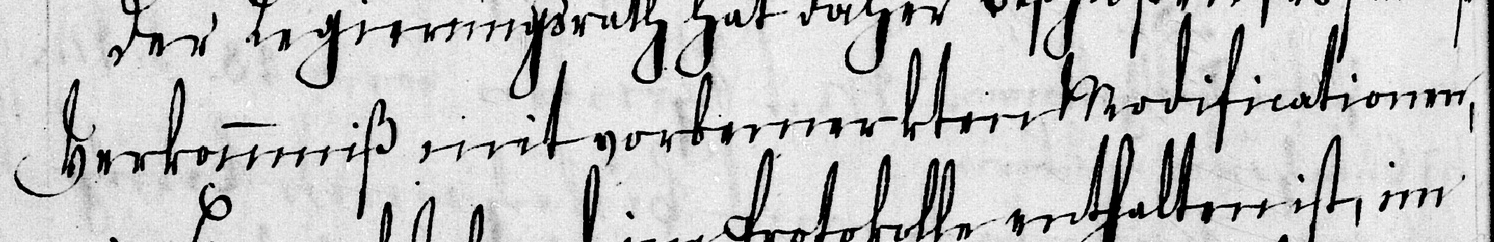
Verkommniß mit vorbemerkten Modificationen,
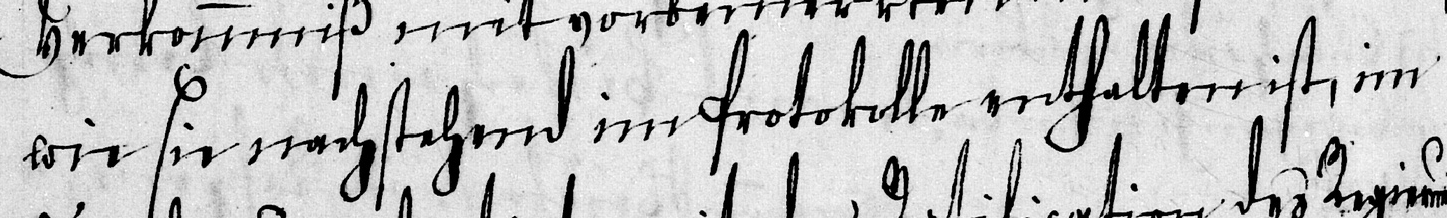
wie sie nachstehend im Protokolle enthalten ist, im
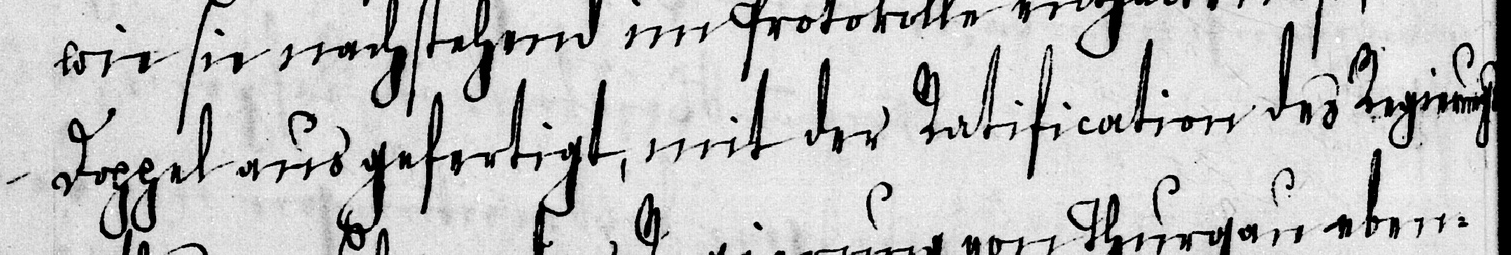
Doppel ausgefertigt, mit der Ratification des Regier¬
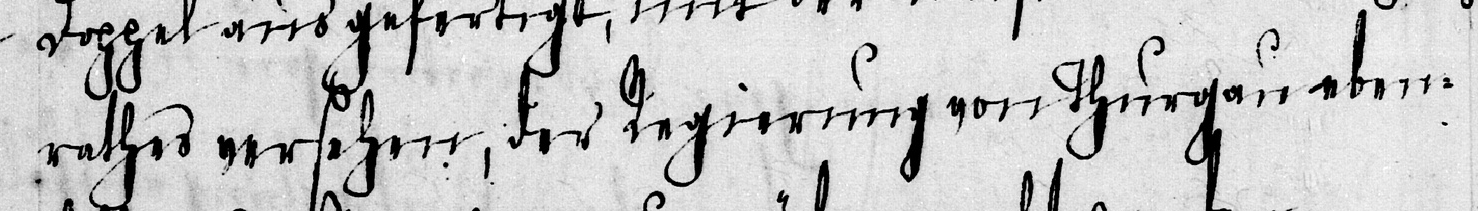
rathes versehen, der Regierung von Thurgau eben¬
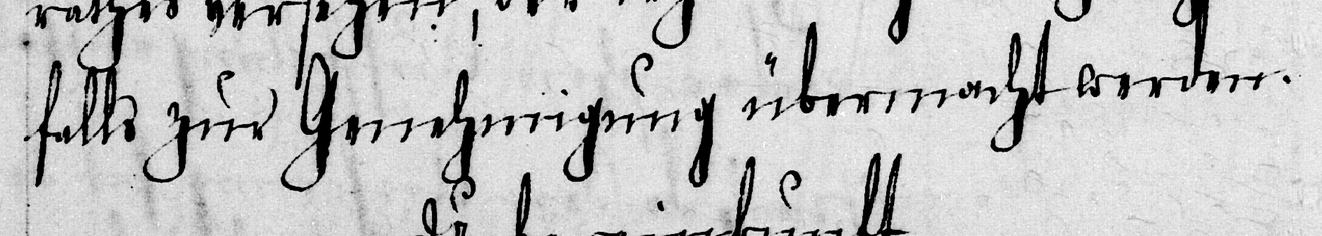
falls zur Genehmigung übermacht werden.
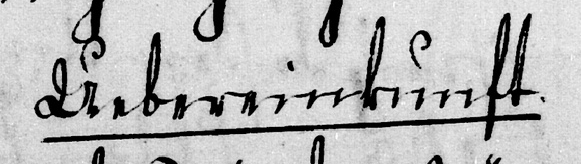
Uebereinkunft
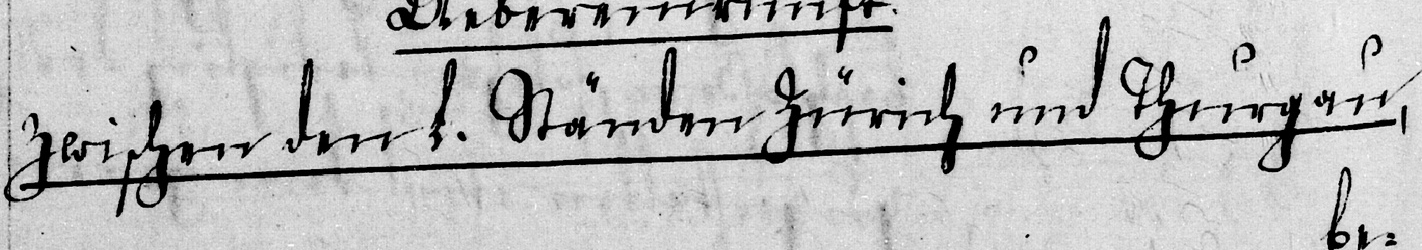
zwischen den L. Ständen Zürich und Thurgau,
